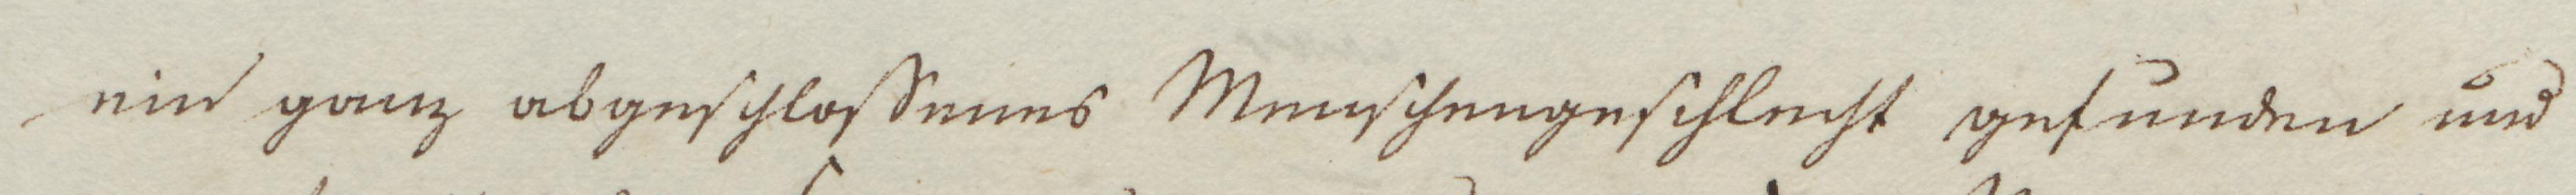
ein ganz abgeschlossenes Menschengeschlecht gefunden und
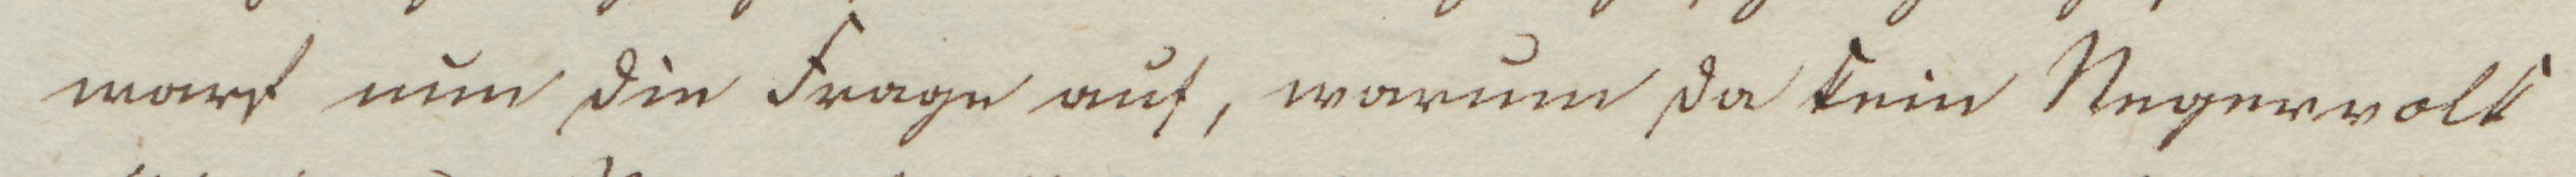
warf nun die Frage auf, warum da kein Negervolk
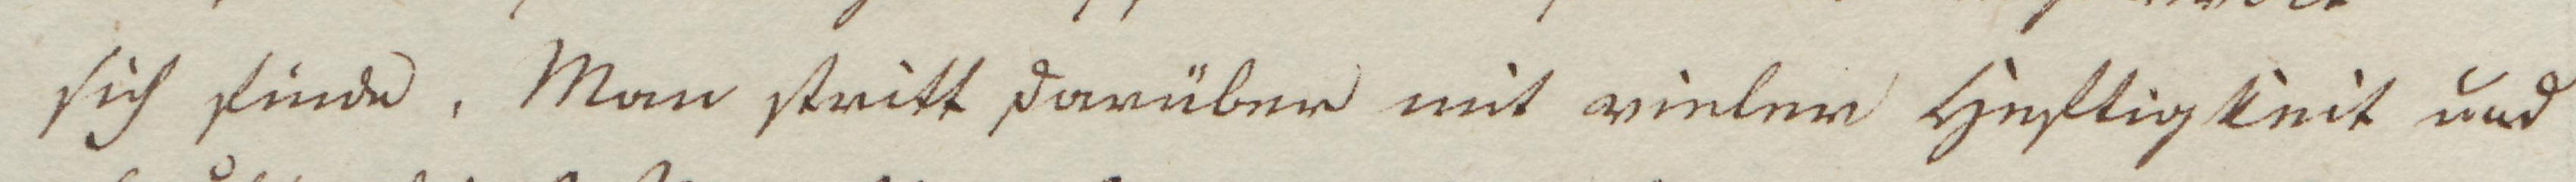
sich finde. Man stritt darüber mit vieler Heftigkeit u.nd
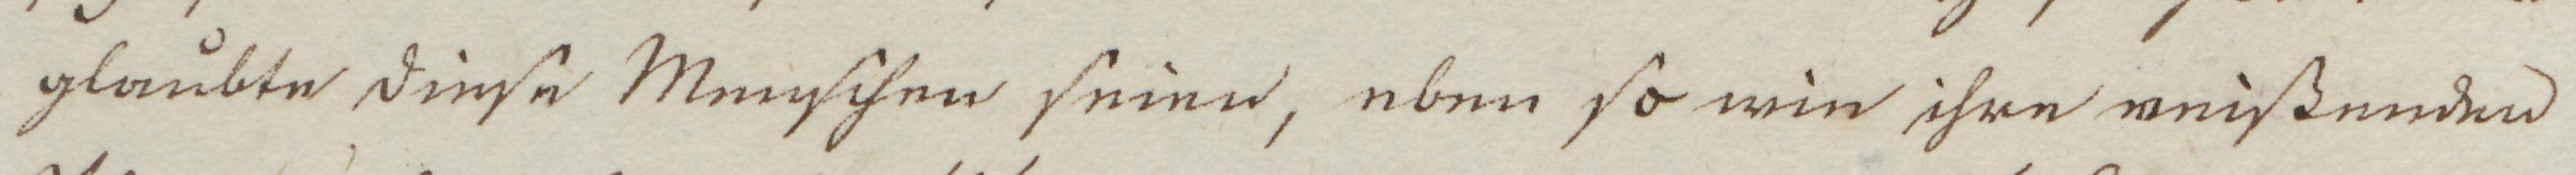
glaubte diese Menschen seien, eben so wie ihre nreißenden
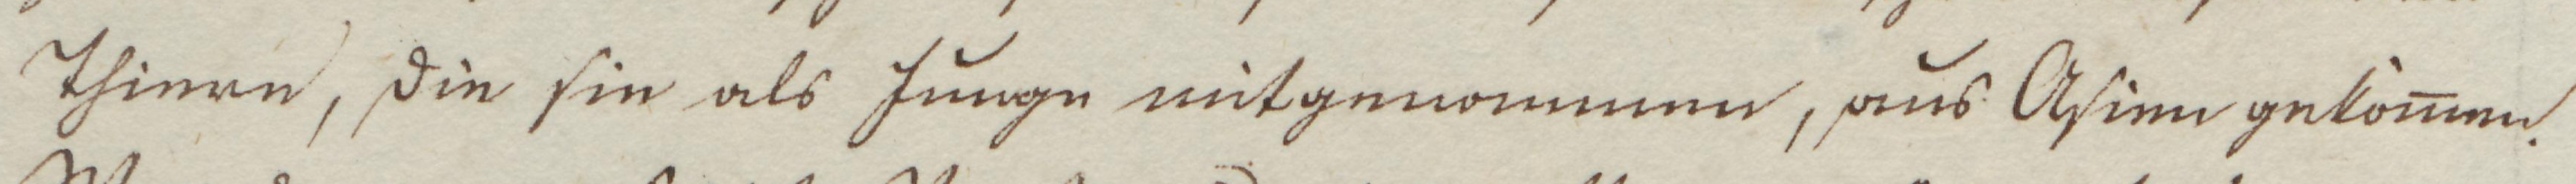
Thiere, die sie als Junge mitgenommen, aus Asien gekommen.
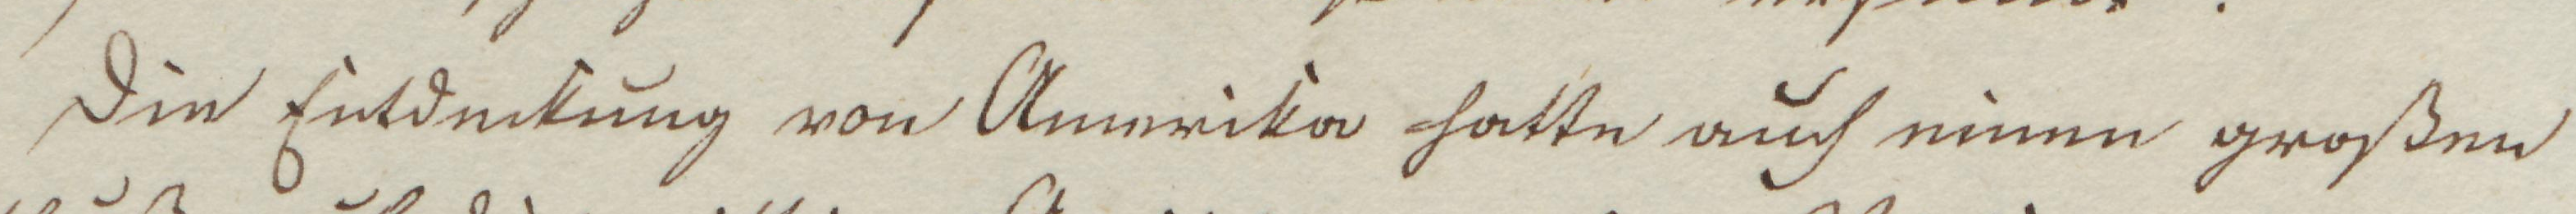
Die Entdeckung von Amerika hatte auch einen großen
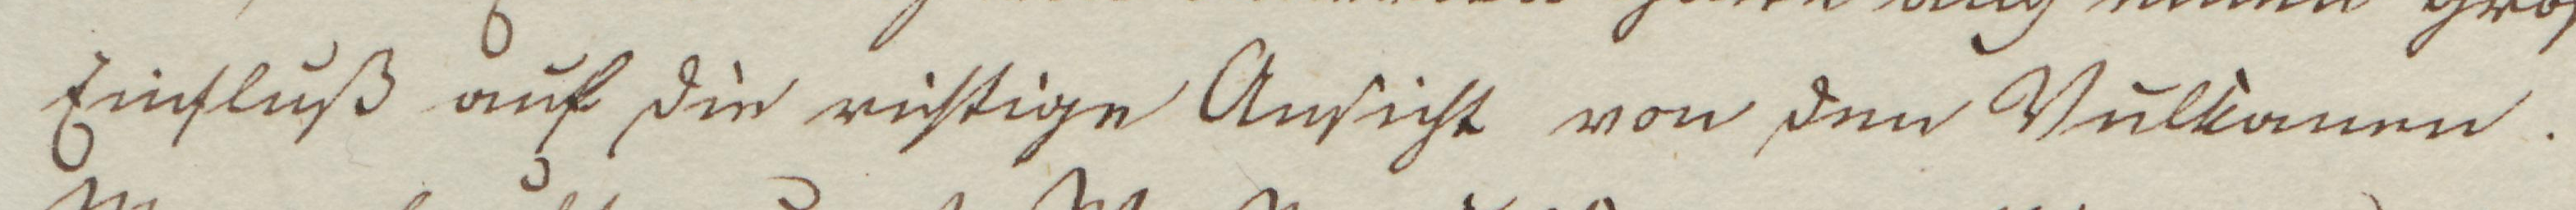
Einfluß auf die richtige Ansicht von den Vulkanen.
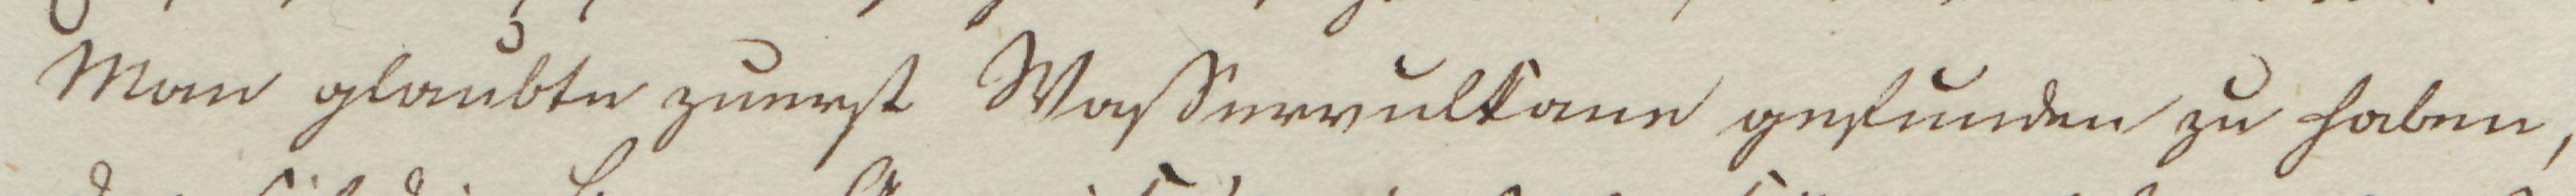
Man glaubte zuerst Wasservulkane gefunden zu haben,
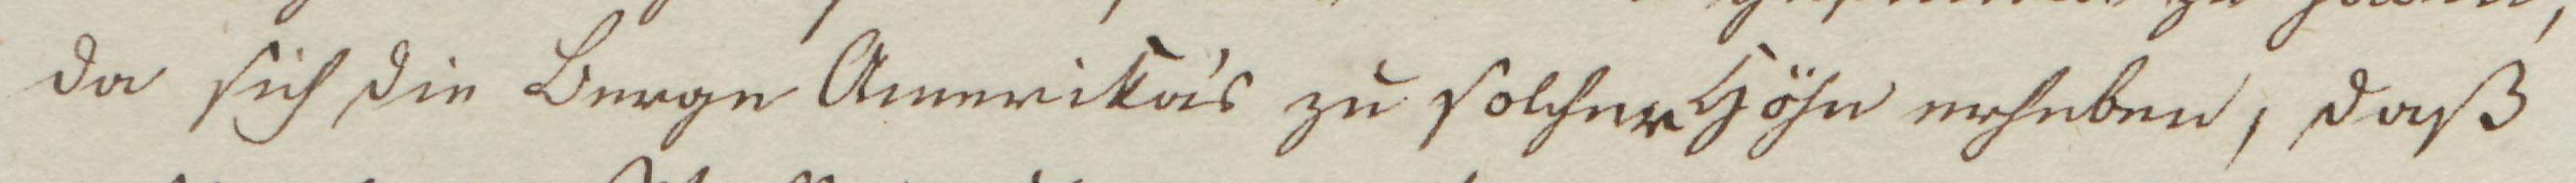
da sich die Berge Amerika's zu solcher Höhe erheben, daß
